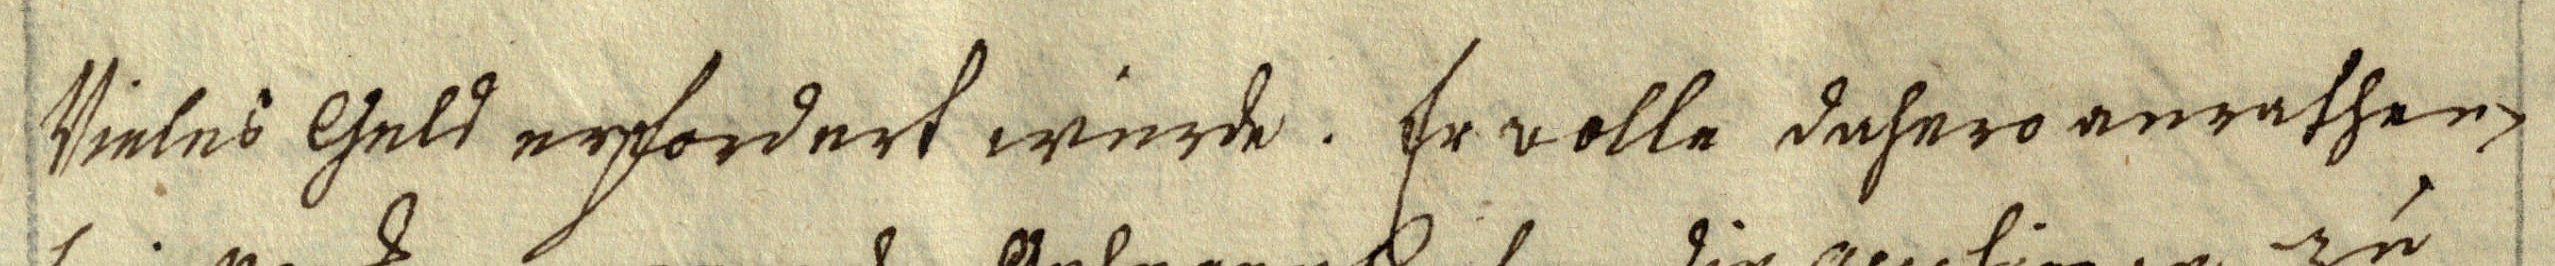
Vieles Geld erfordert würde. Er wolle dahero anrathen,
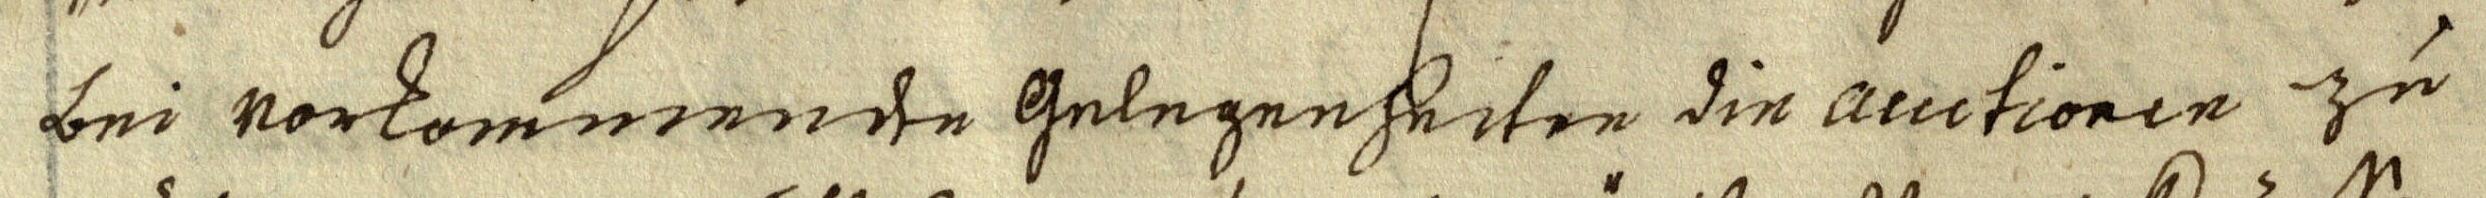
bei vorkommenden Gelegenheiten die auctionen zu
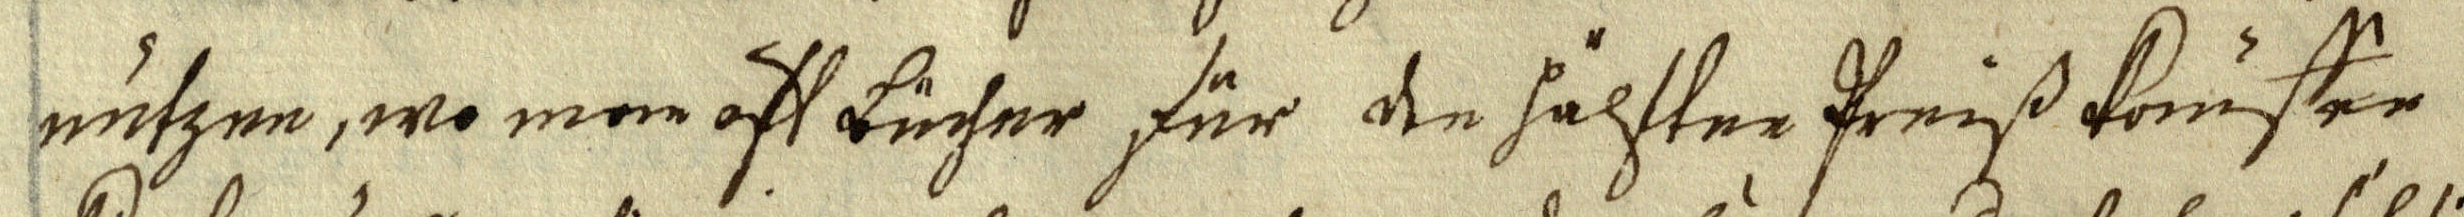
nutzen, wo man oft Bücher für den hälften Preiß kauffen
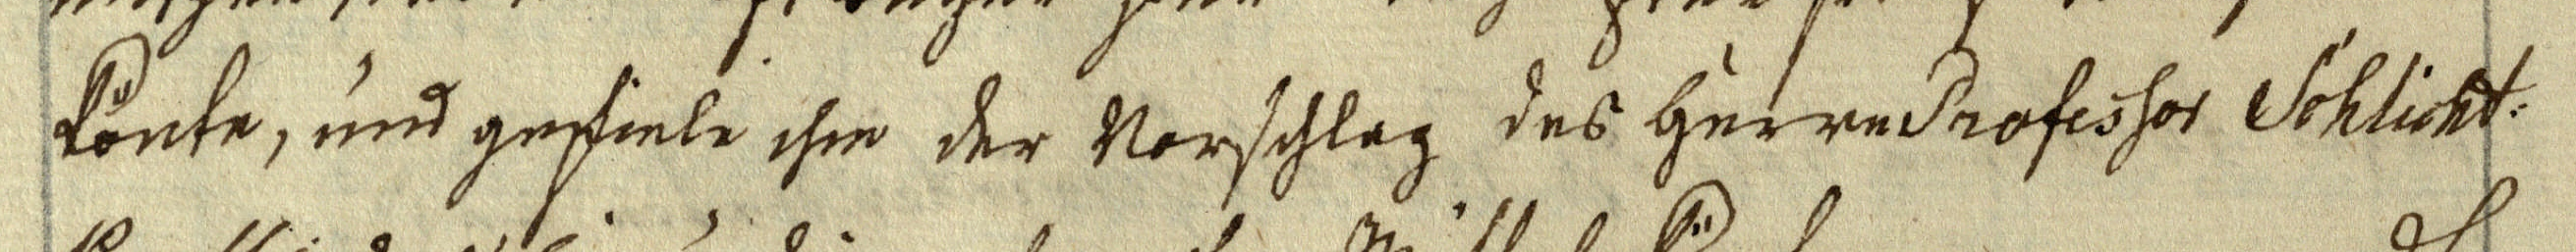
könte, und gefiele ihm der Vorschlag, des Herrn Professor Schlicht¬
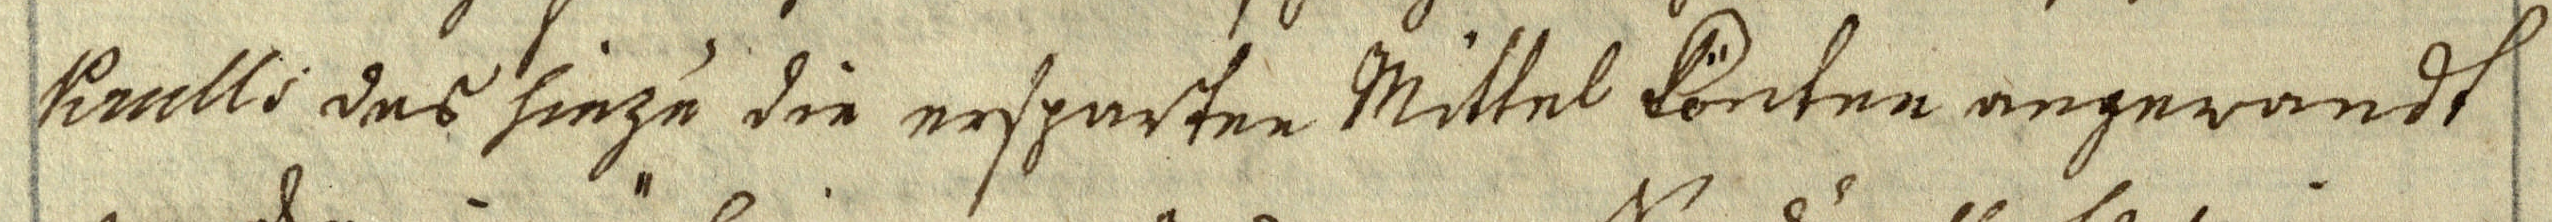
krulls das hiezu die ersparten Mittel könten angewandt
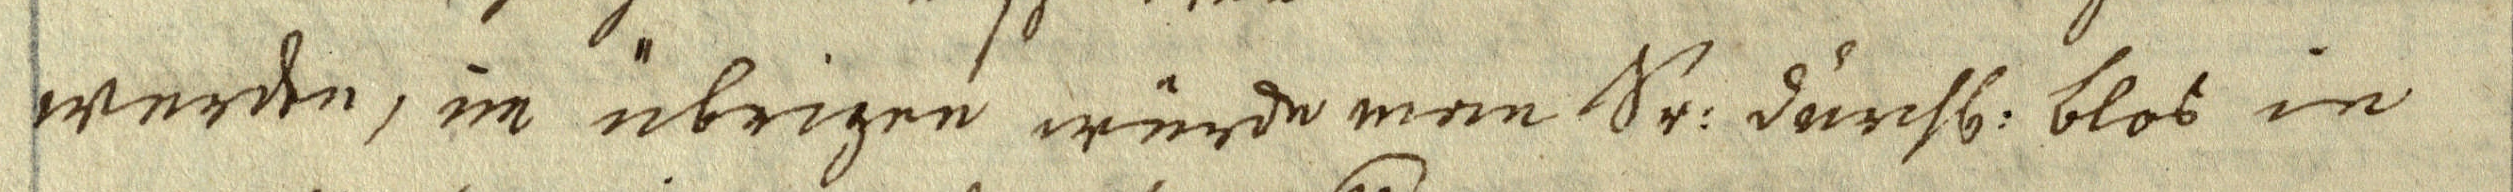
werden, im übrigen würde man Sr Durchl. blos in
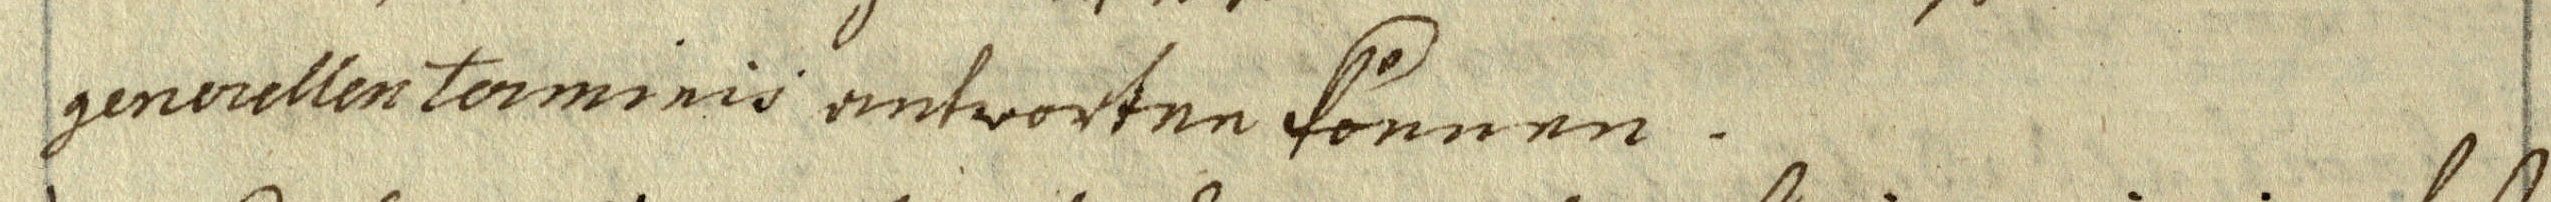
generellen terminis antworten können.
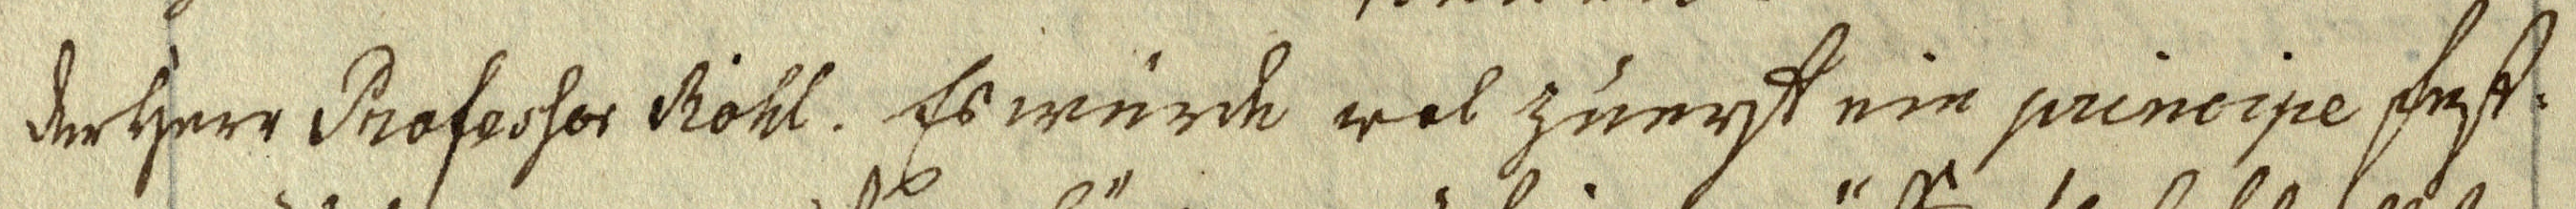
Der Herr Professor Röhl. Es würde wohl zuerst ein principe fest¬
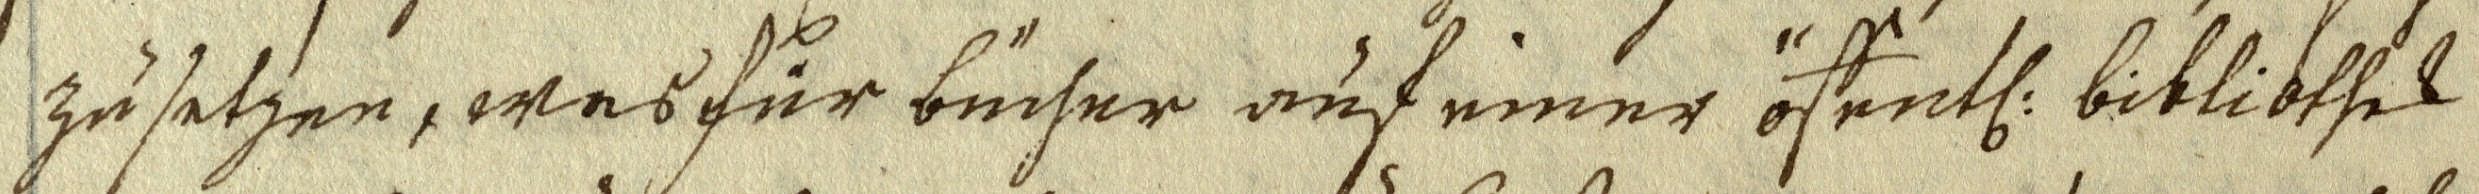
zusetzen, was für Bücher auf einer öffentl. Bibliothek
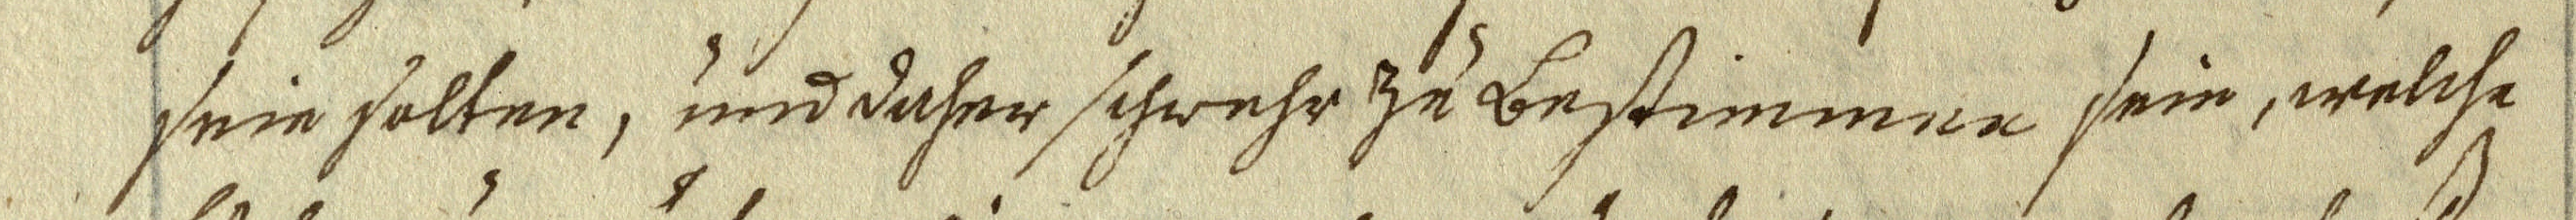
sein solten, und daher schwehr zu bestimmen sein, welche
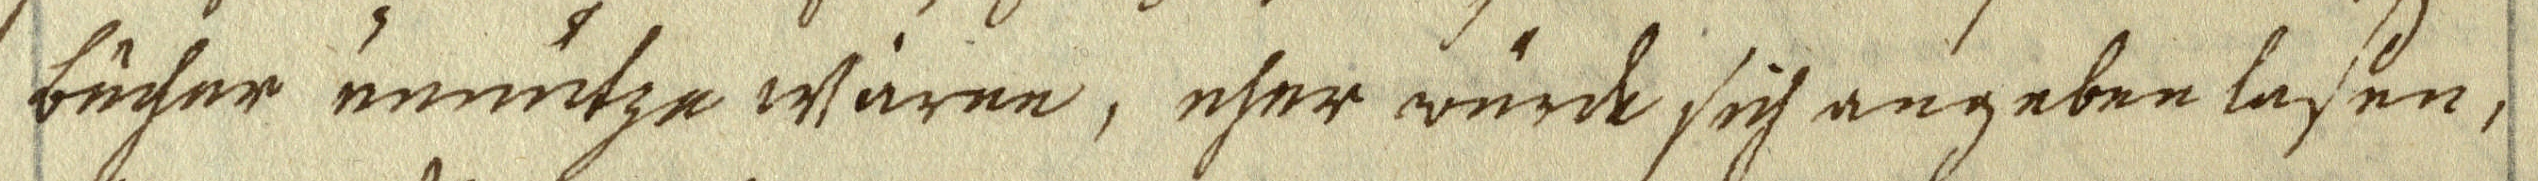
Bücher unnütze wären, eher würde sich angeben laßen,
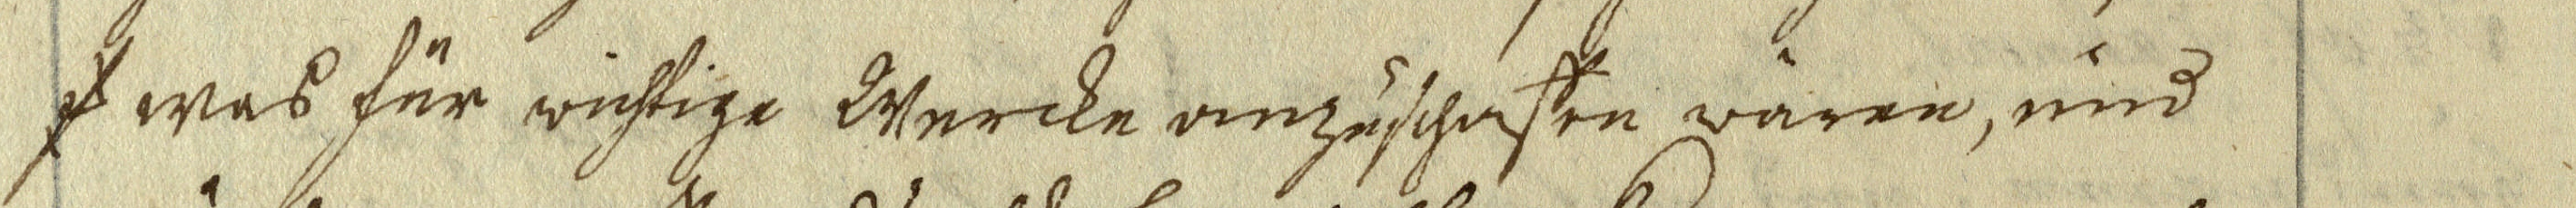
f was für wichtige Wercke anzuschaffen wären, und
